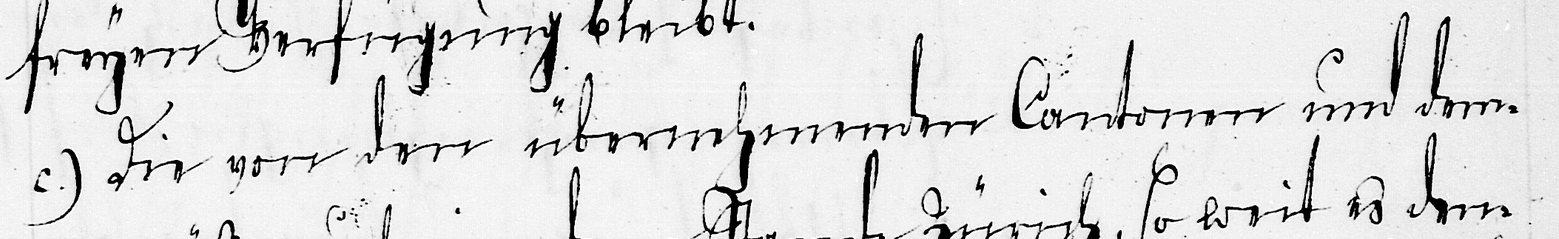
c.) Die von den übernehmenden Cantonen und dem¬
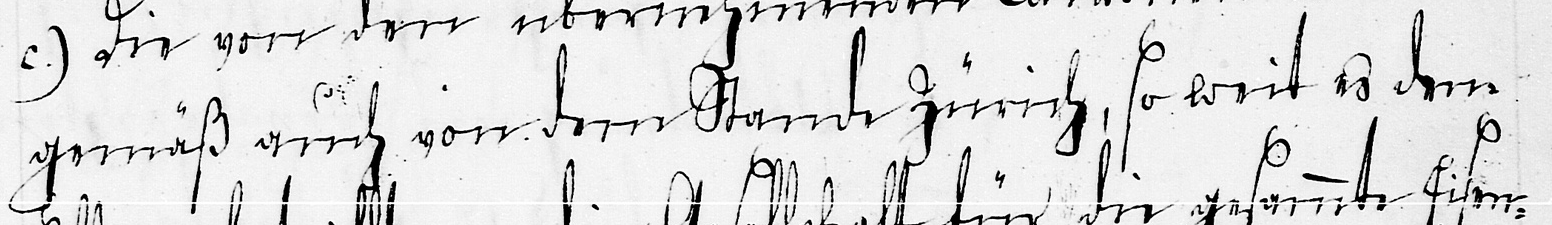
gemäß auch von dem Stande Zürich, soweit es den¬
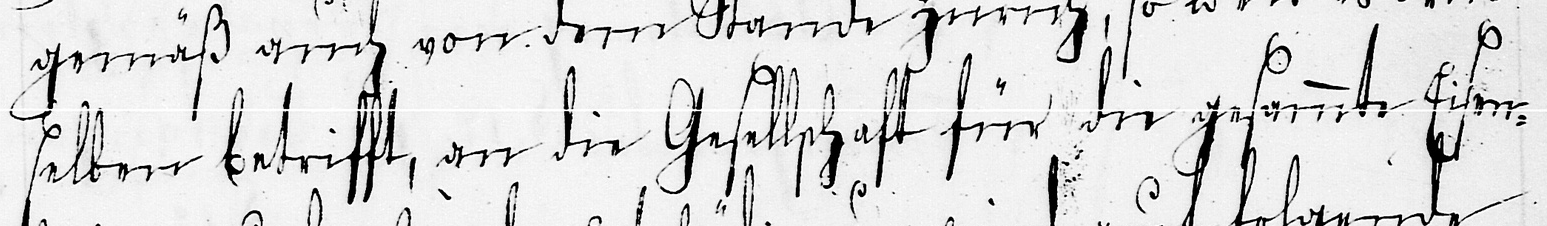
selben betrifft, an die Gesellschaft für die gesam¬
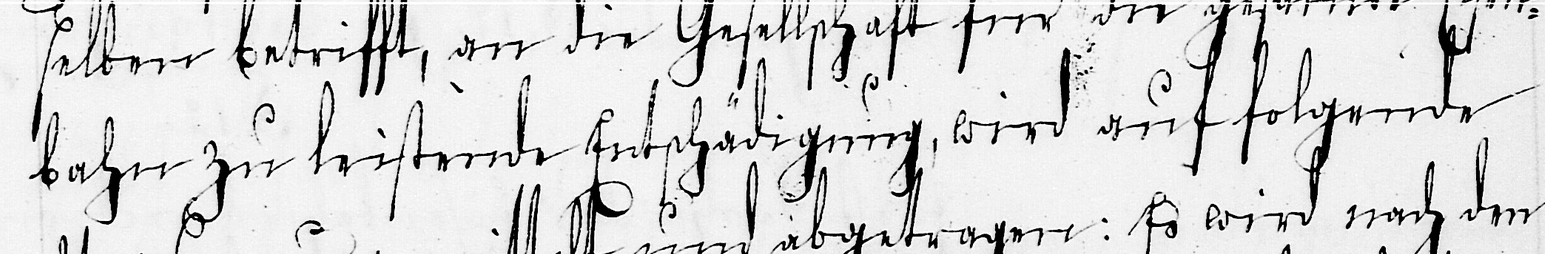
bahn zu leistende Entschädigung, wird auf folgende
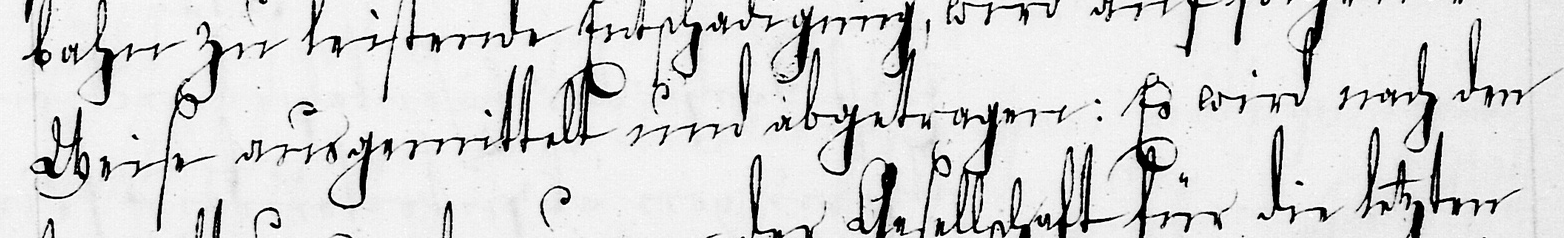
Weise ausgemittelt und abgetragen: Es wird nach den
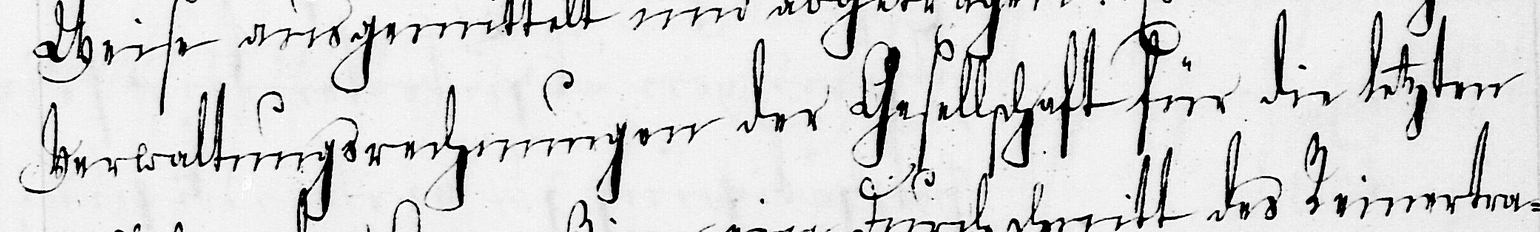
Verwaltungsrechnungen der Gesellschaft für die letzten
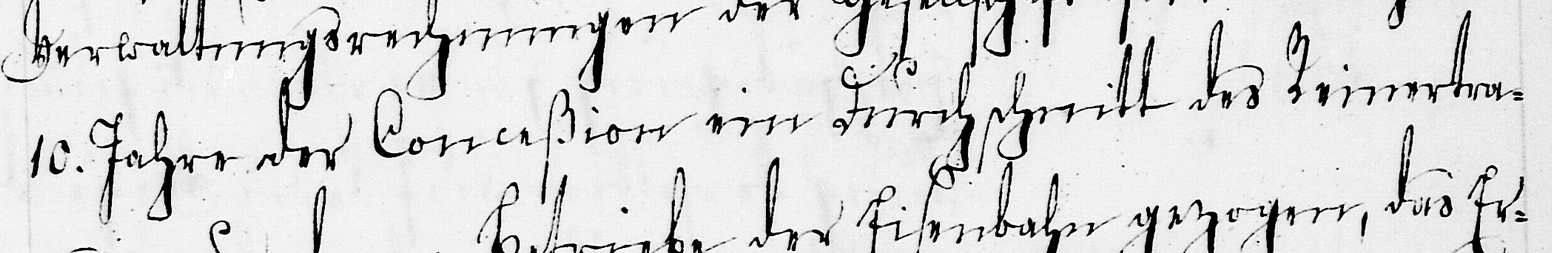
10. Jahre der Conceßion ein Durchschnitt des Reinertra¬
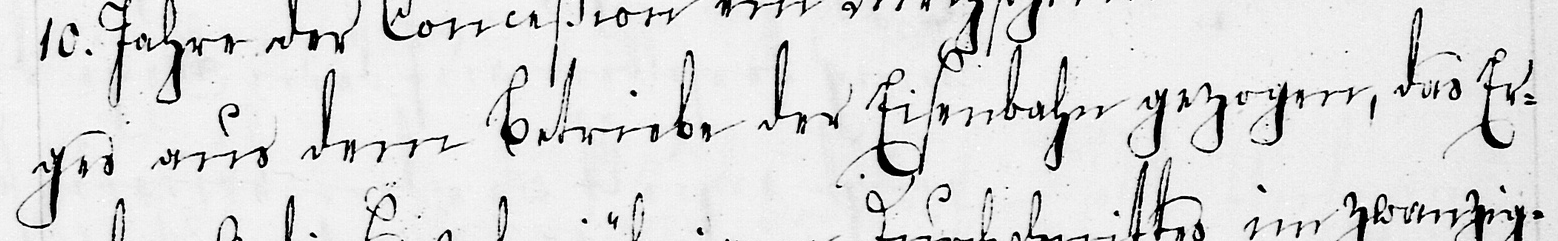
ges aus dem Betriebe der Eisenbahn gezogen, das Er¬
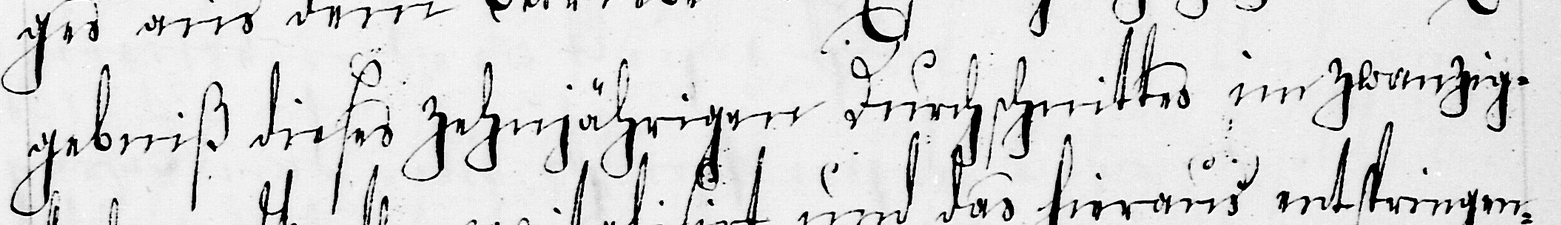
gebniß dieses zehnjährigen Durchschnittes im zwanzig¬
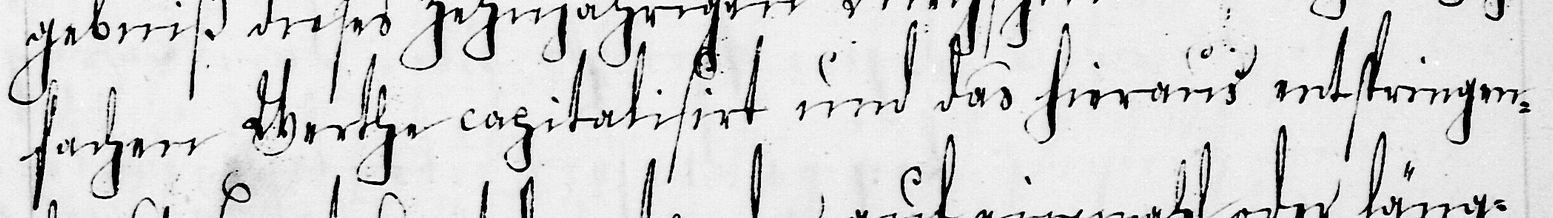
fachen Werthe capitalisirt und das hieraus entspringen¬
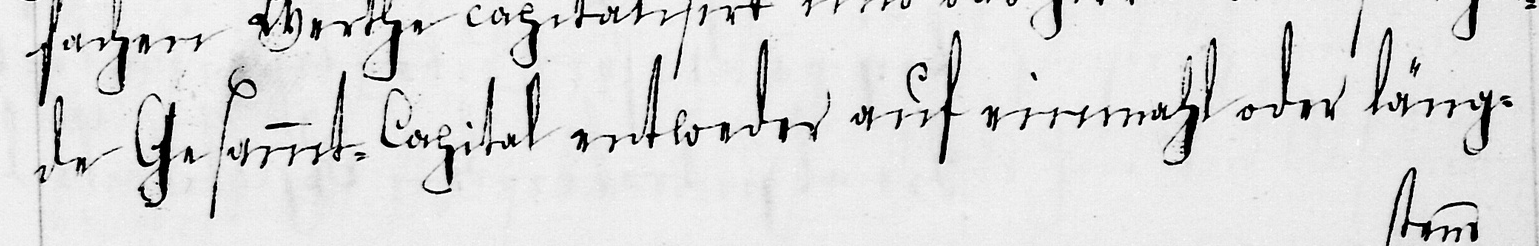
de Gesammt-Capital entweder auf einmahl oder läng-
